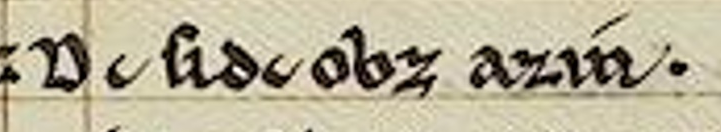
D(az) ſi d(az) obz azin.
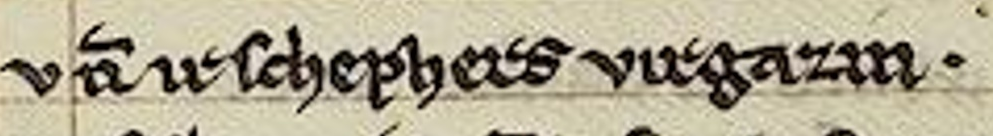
Vn(d) ir ſchephers virgazin.
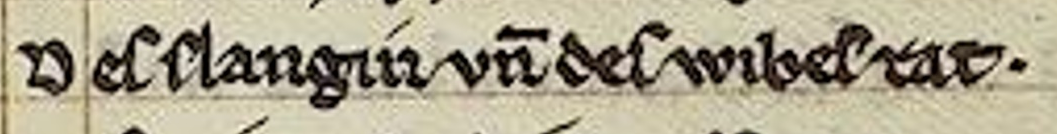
Deſ ſlangin vn(d) deſ wibeſ rat.
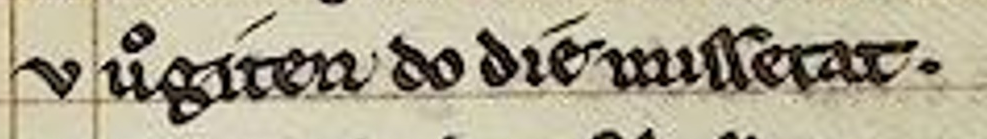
Vu°ogiten do die miſſetat.
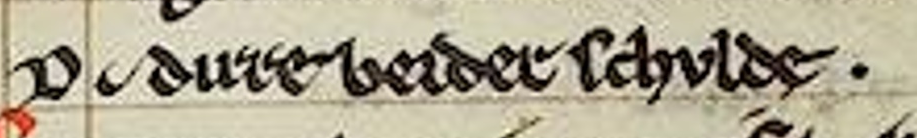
D(az) dirre beider ſchvlde.
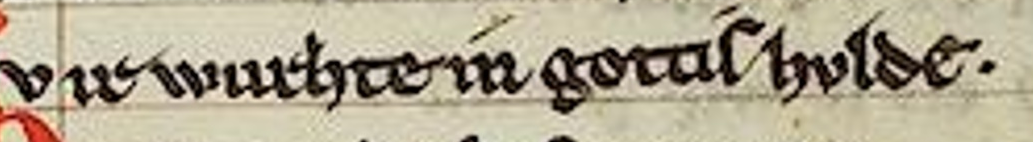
Vir wurhte in gottiſ hvlde.
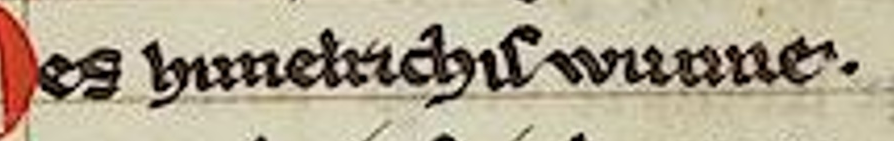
*Des himelrichiſ wunne.
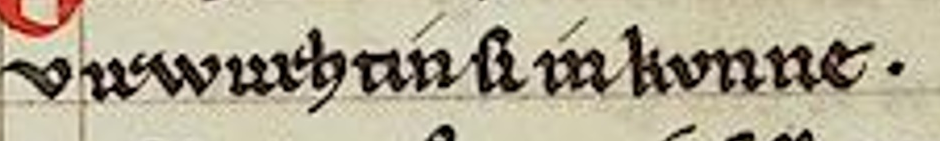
Virwurhtin ſin in kvnne.
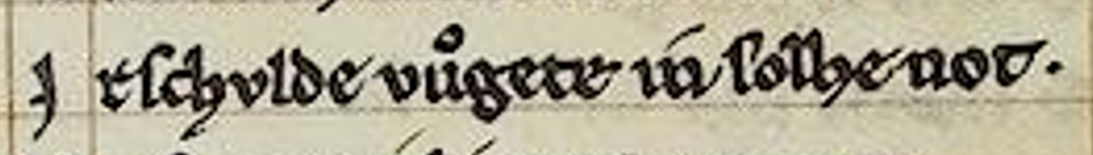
Irſchvlde vu°ogete in ſolhe not.
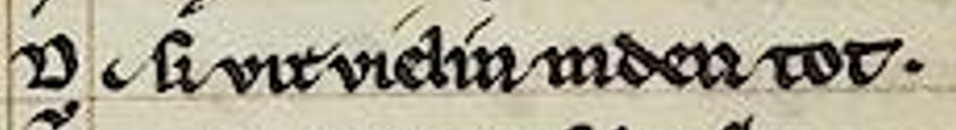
D(az) ſi vir vielin inden tot.
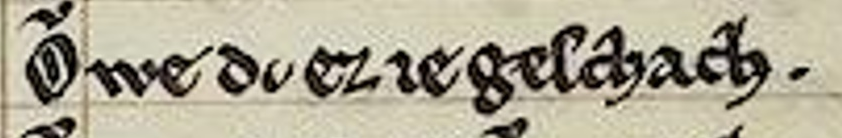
O°vwe d(az) ez ie geſchach.
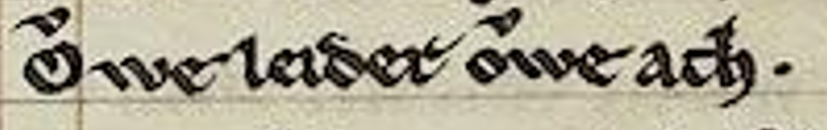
O°vwe leider o°vwe ach.
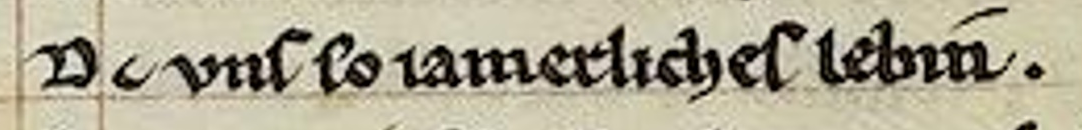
D(az) vnſ ſo iamerlicheſ lebin.
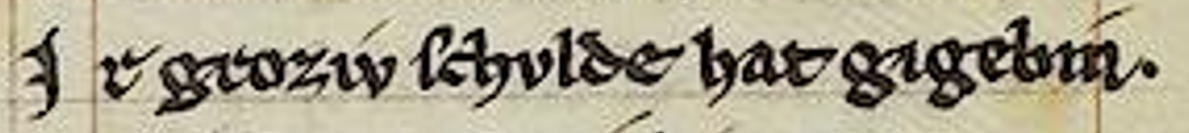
Ir groziv ſchvlde hat gigebin.
